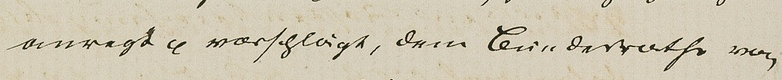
anregt & vorschlägt, dem Bundesrathe von
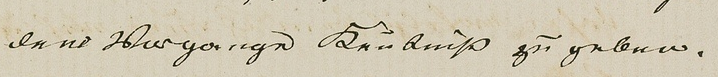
dem Vorgange Kenntniß zu geben.
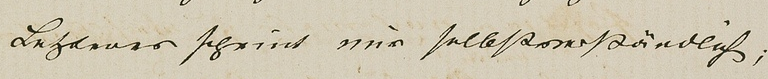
Letzteres scheint mir selbstverständlich;
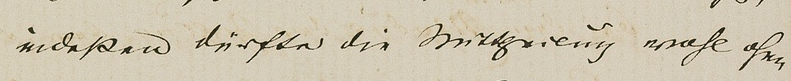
indeßen dürfte die Mittheilung wohl ohne
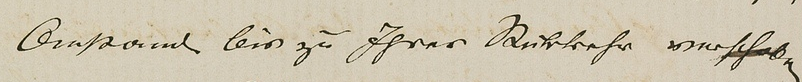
Anstand bis zu Ihrer Rükkehr verschoben
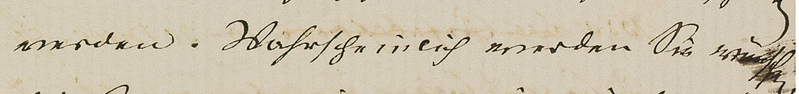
werden. Wahrscheinlich werden Sie wünschen,
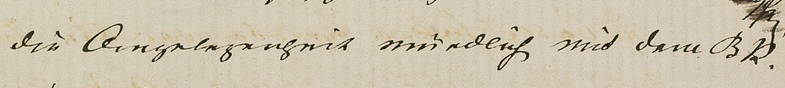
die Angelegenheit mündlich mit dem BR.
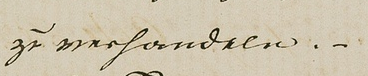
zu verhandeln. –
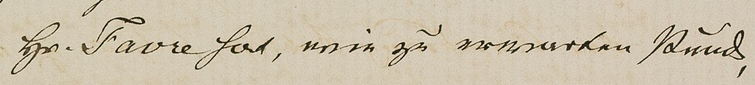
Hr. Favre hat, wie zu erwarten stund,
